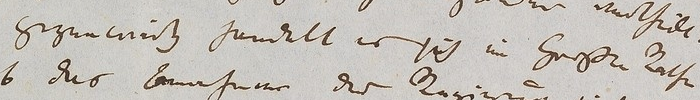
Gegenwärtig handelt es sich im Großen Rathe
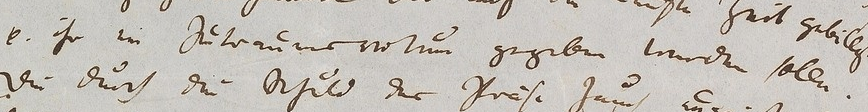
&. ihr ein Zutrauensvotum gegeben werden solle.
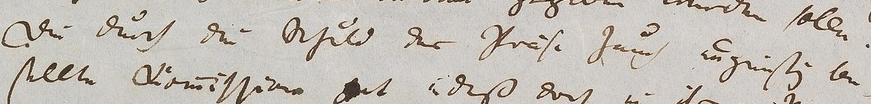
Die durch die Schuld des Präs. Jauch ungünstig be-
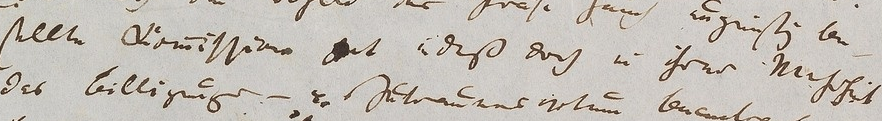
stellte Kommission hat indeß doch in ihrer Mehrheit
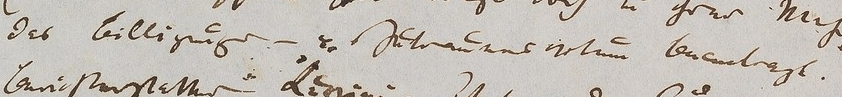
das Billigungs- &. Zutrauensvotum beantragt.
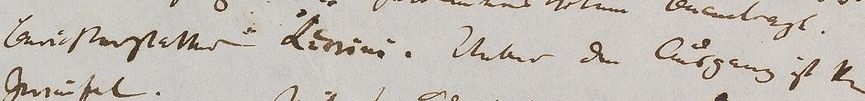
Berichterstatter Luvini. Ueber den Ausgang ist kein
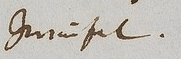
Zweifel.
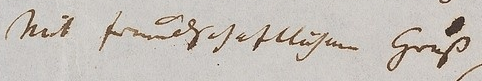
Mit freundschaftlichem Gruß
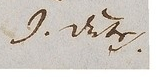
J. Dubs.
